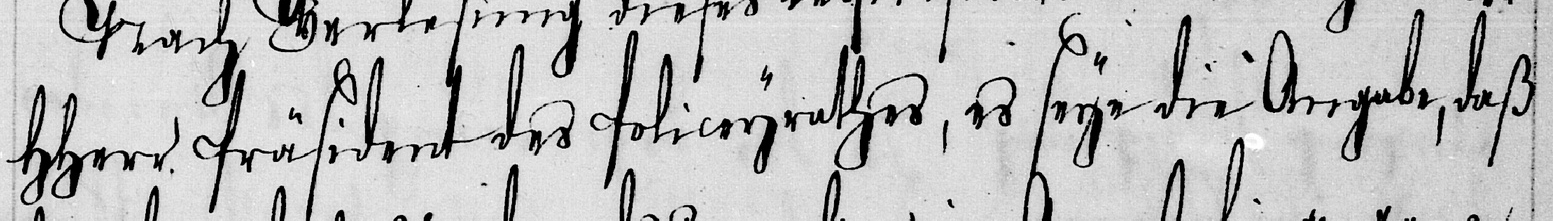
Herr Präsident des Policeyrathes, es seye die
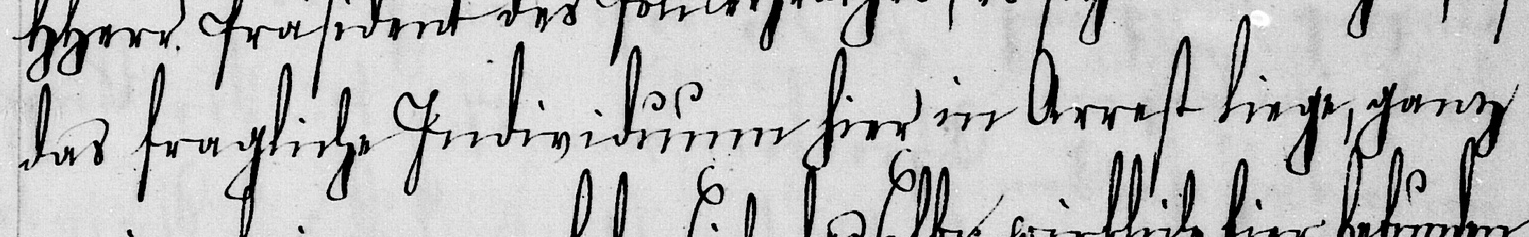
das fragliche Individuum hier in Arrest liege, ganz
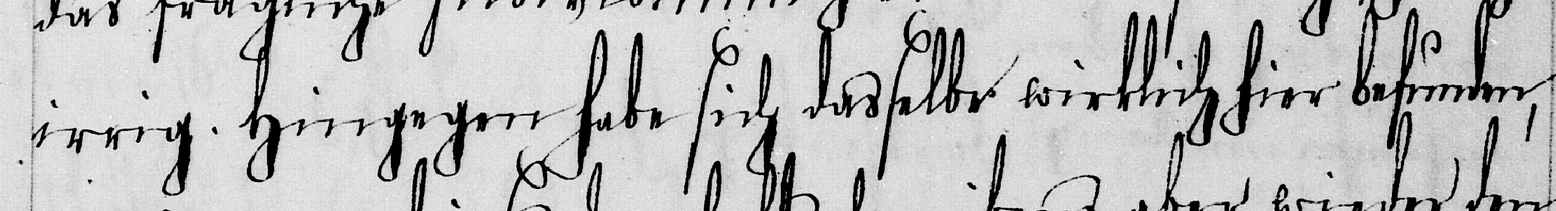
irrig. Hingegen habe sich dasselbe wirklich hier befun¬
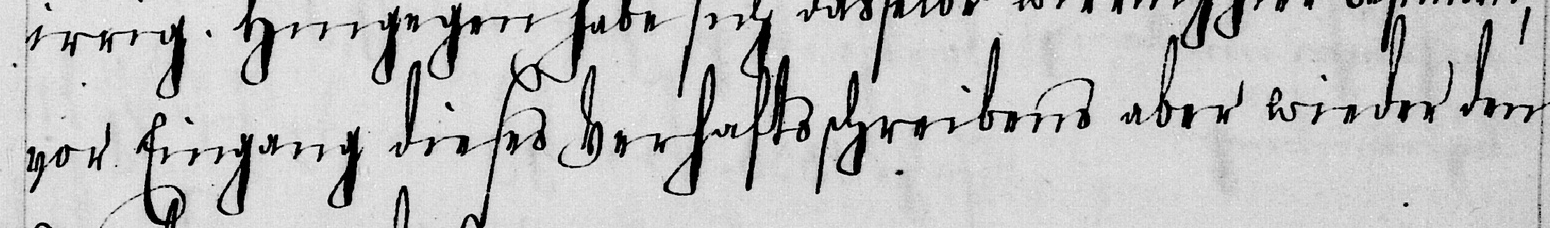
vor Eingang dieses Verhaftsschreibens aber wieder den
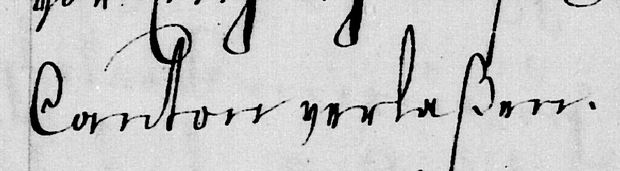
Canton verlaßen.
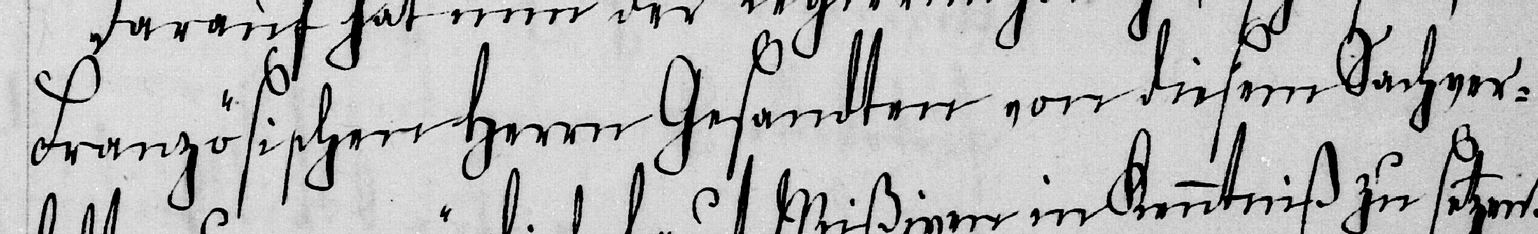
Französischen Herrn Gesandten von diesem Sachver¬
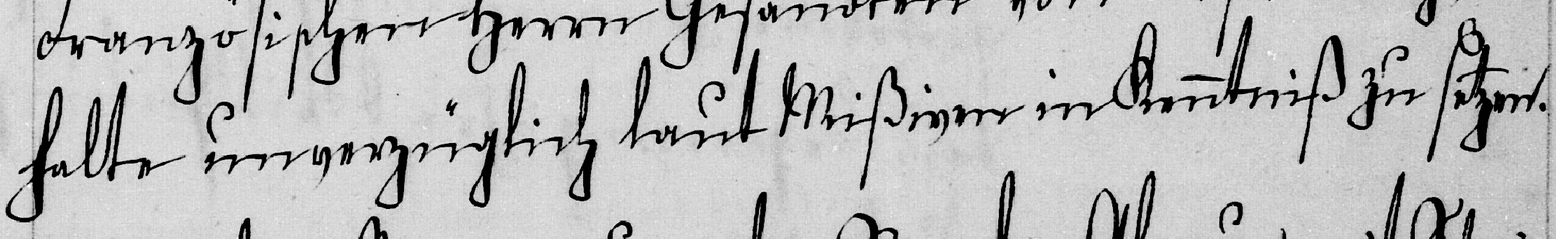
halte unverzüglich laut Mißiven in Kenntniß zu setzen.
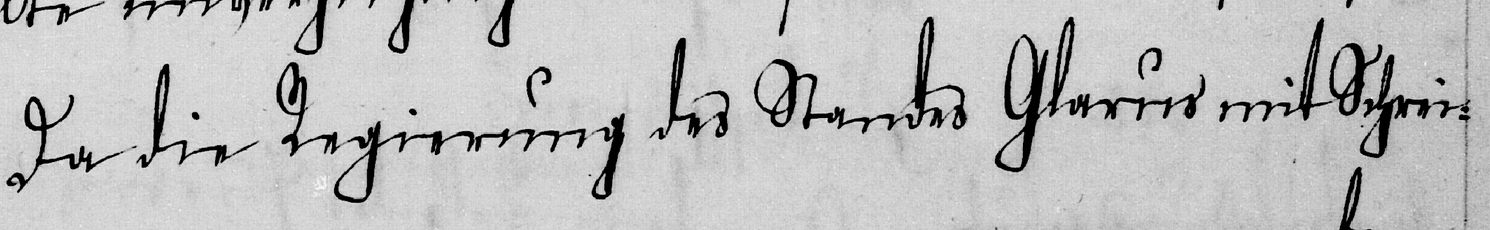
Da die Regierung des Standes Glarus mit Schrei-
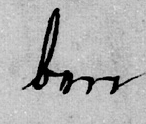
den
